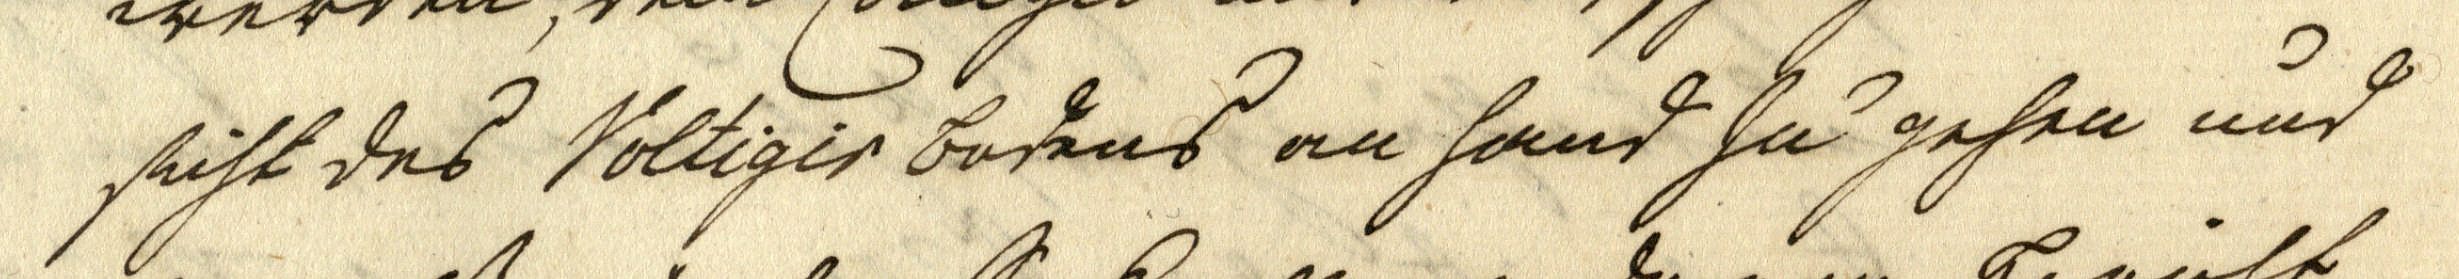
sicht des Voltigirbodens an hand zu gehen und
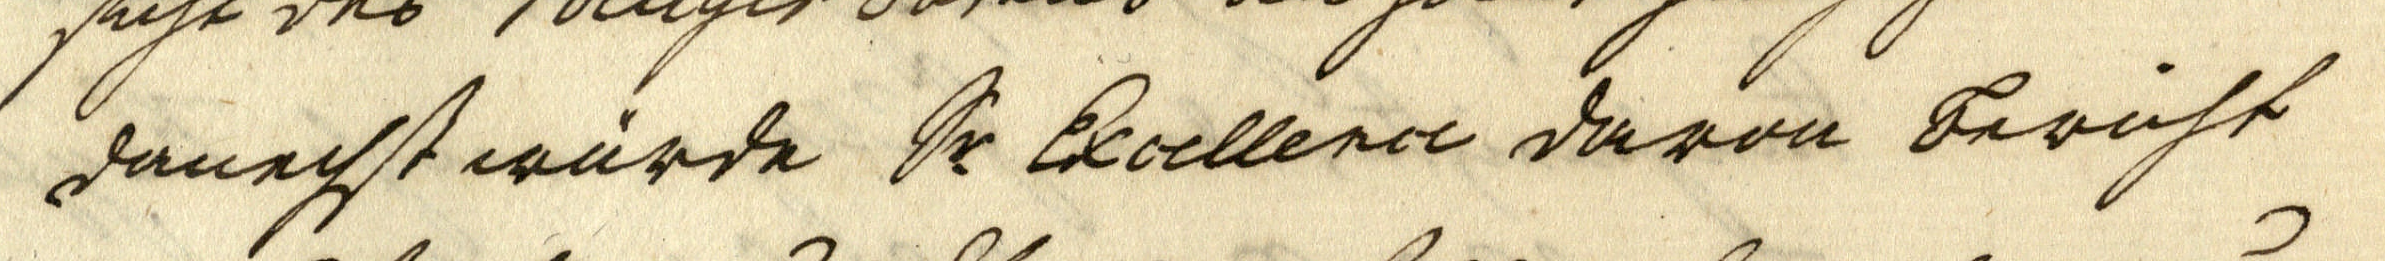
danechst würde Sr. Excellence davon Bericht
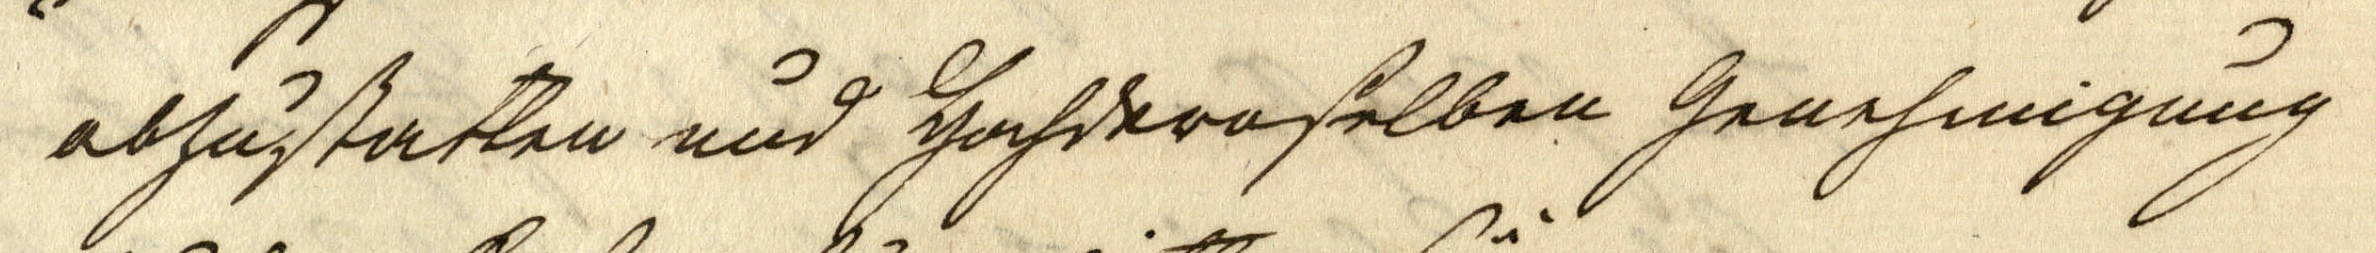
abzustatten und Hochderoselben Genehmigung
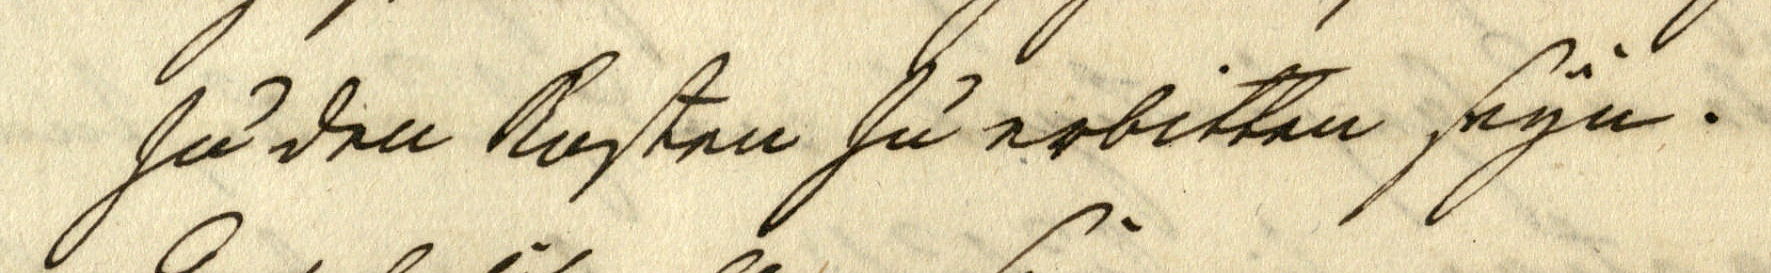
zu den Kosten zu erbitten seyn.
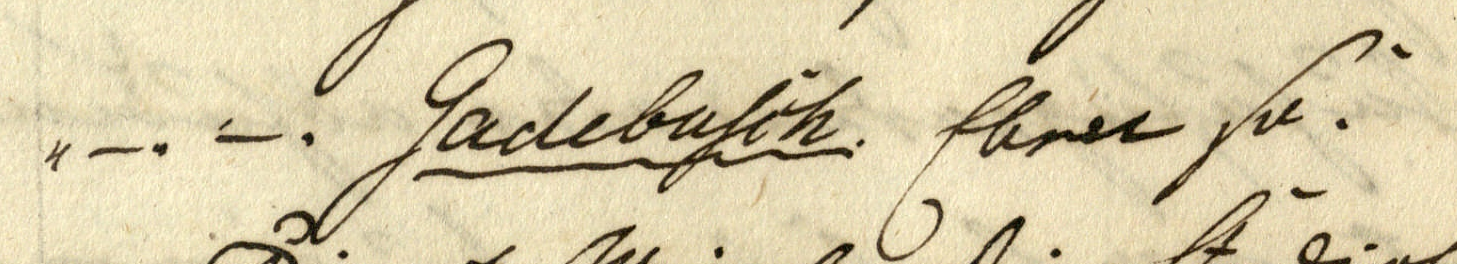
" - " - " Gadebusch. Eben so.
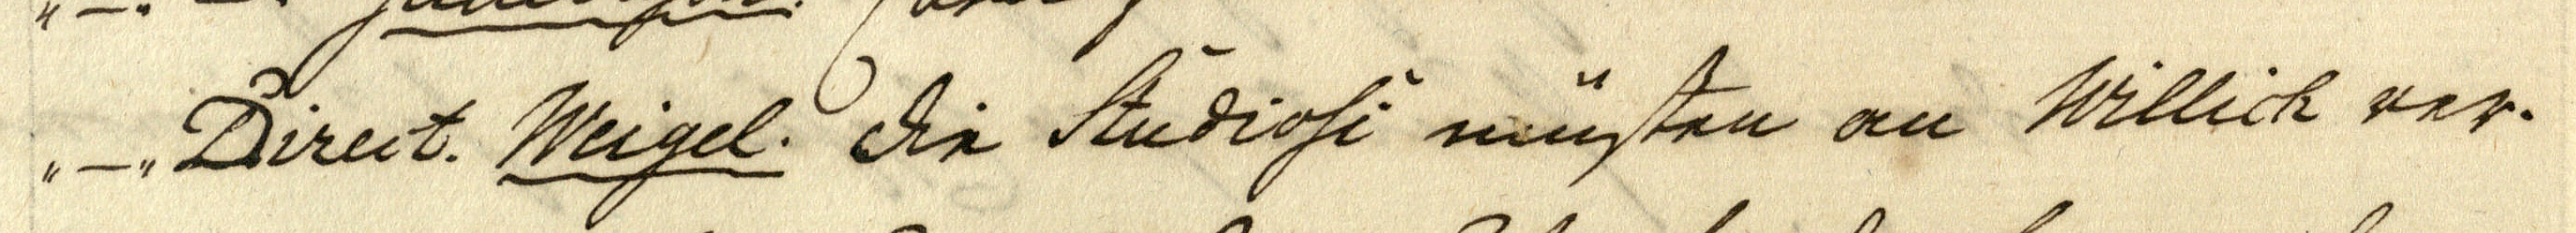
" - " Direct. Weigel. Die Studiosi müßten an Willich ver-
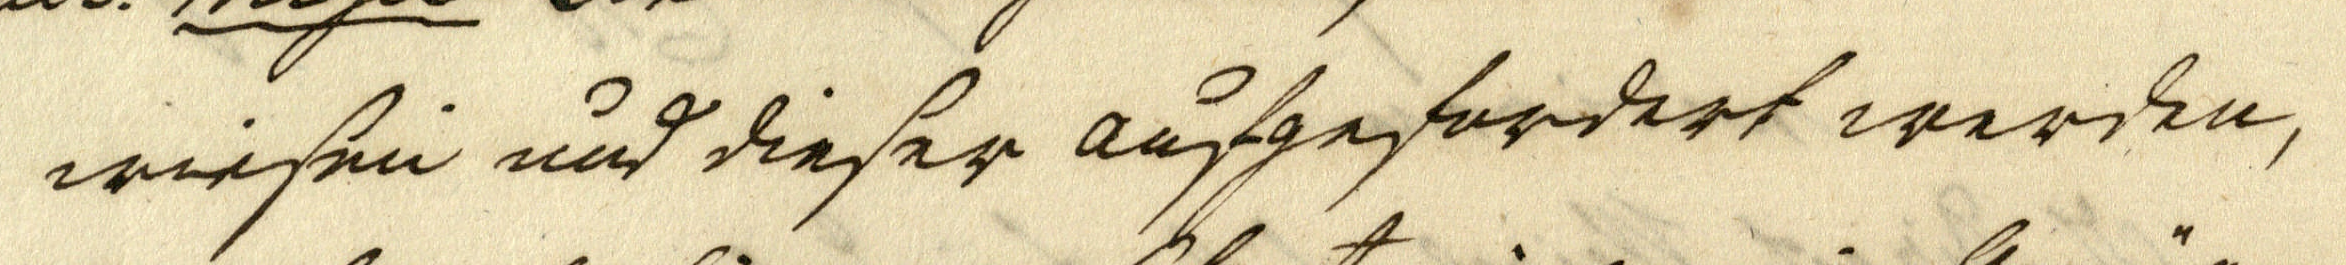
wiesen und dieser aufgefordert werden,
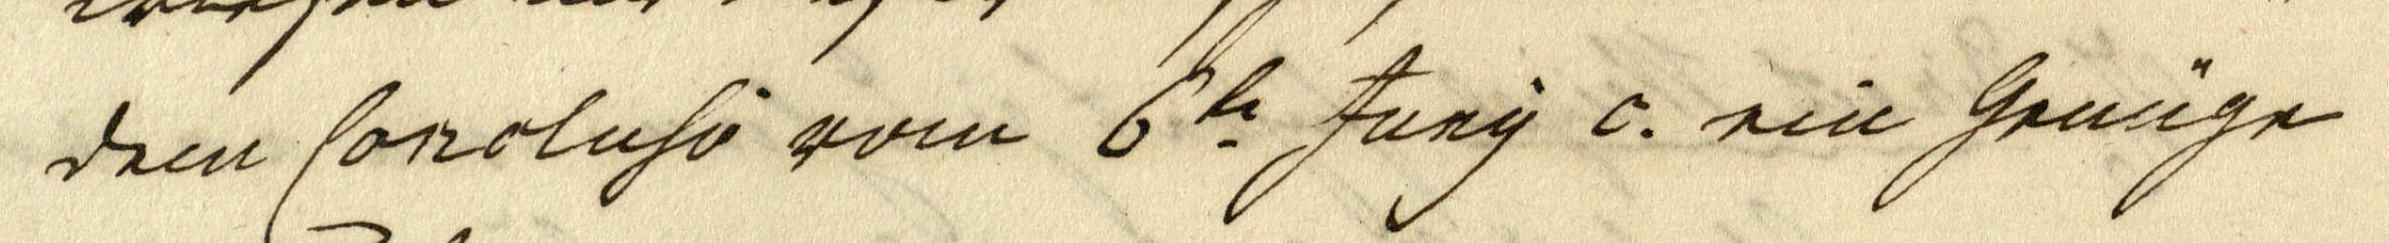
dem Concluso vom 6ten Juny c. ein Genüge
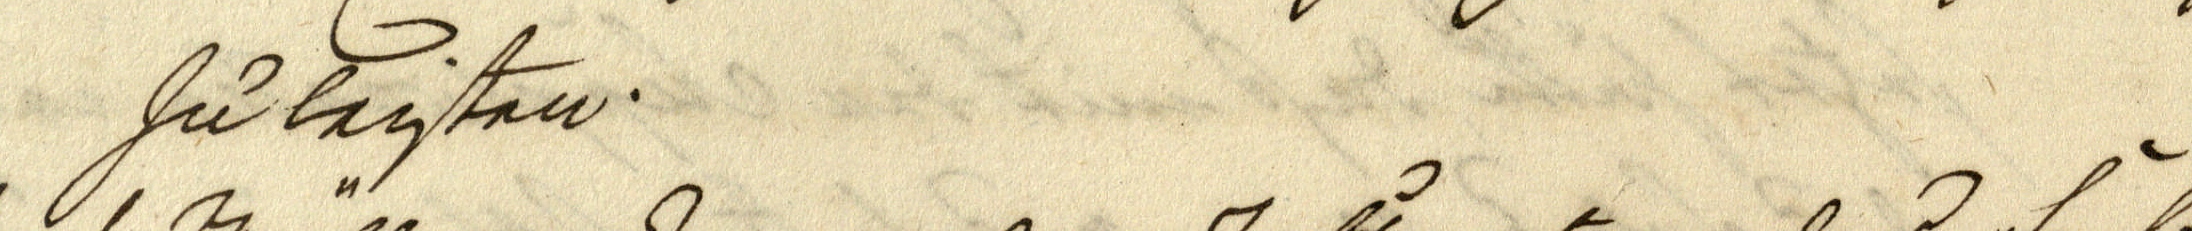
zu leisten.
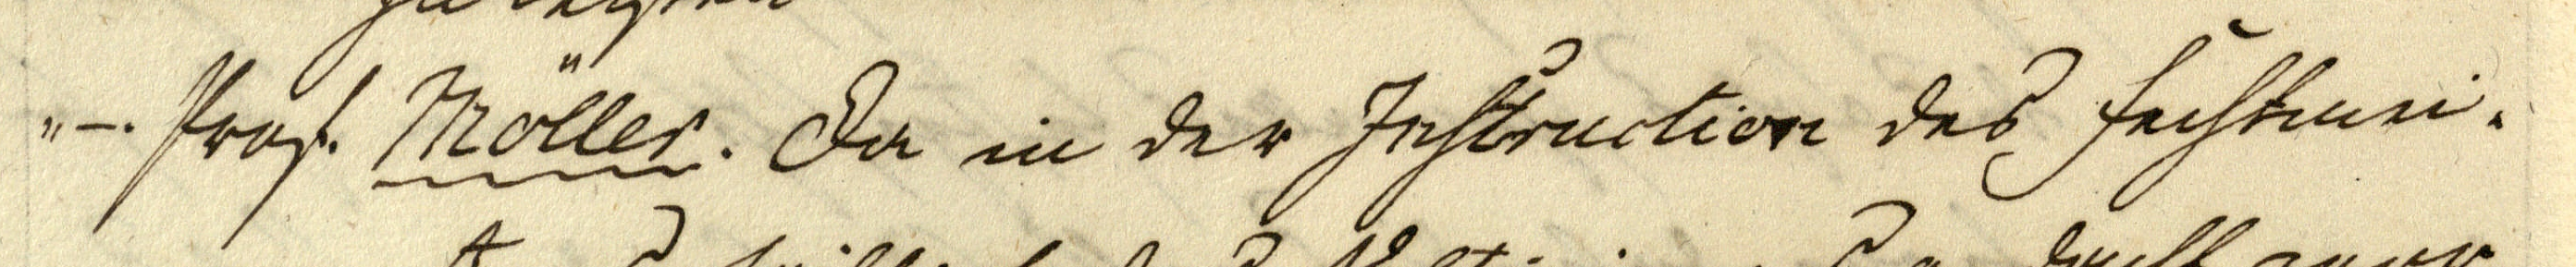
" - . Prof. Möller. Da in der Instruction des Fechtmei-
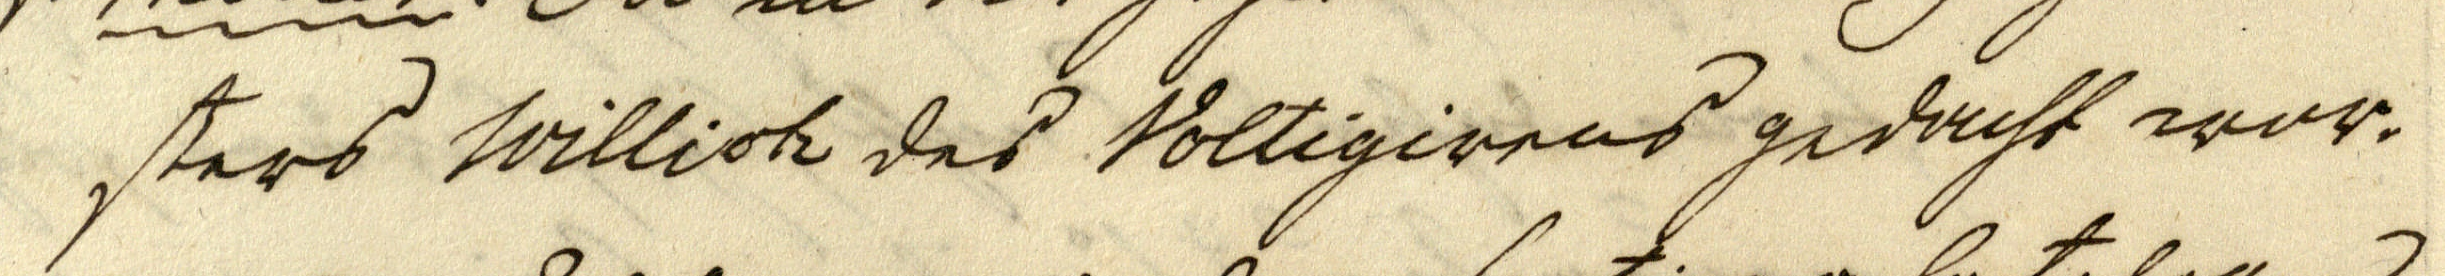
sters Willich des Voltigirens gedacht wor-
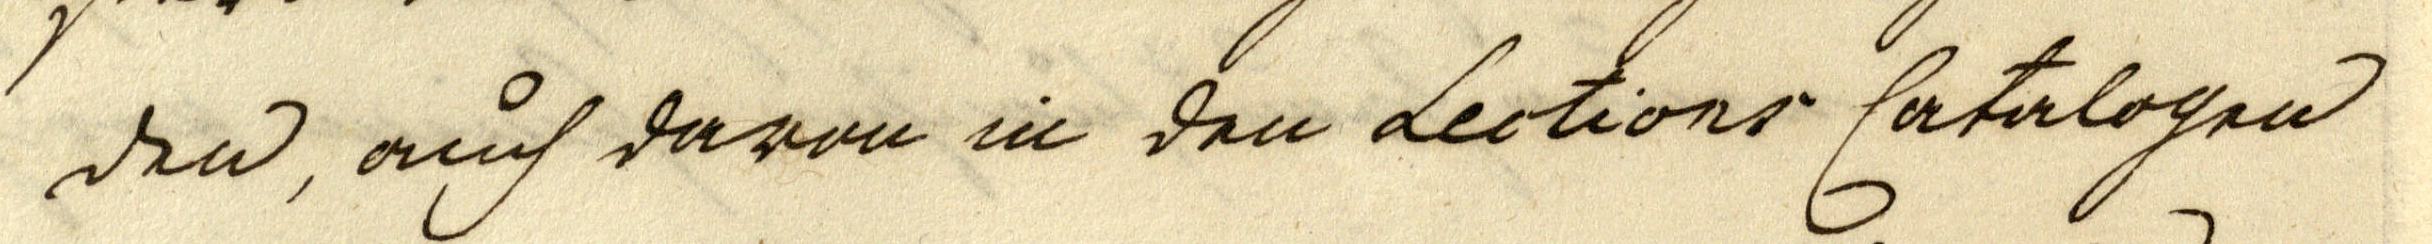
den, auch davon in den Lections Catalogen
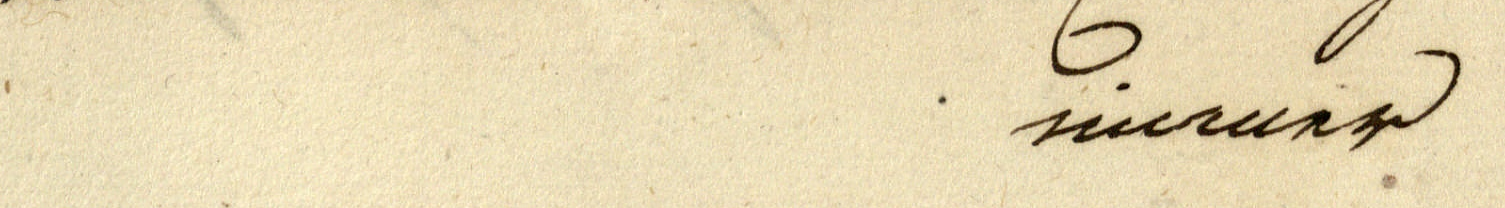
immer
